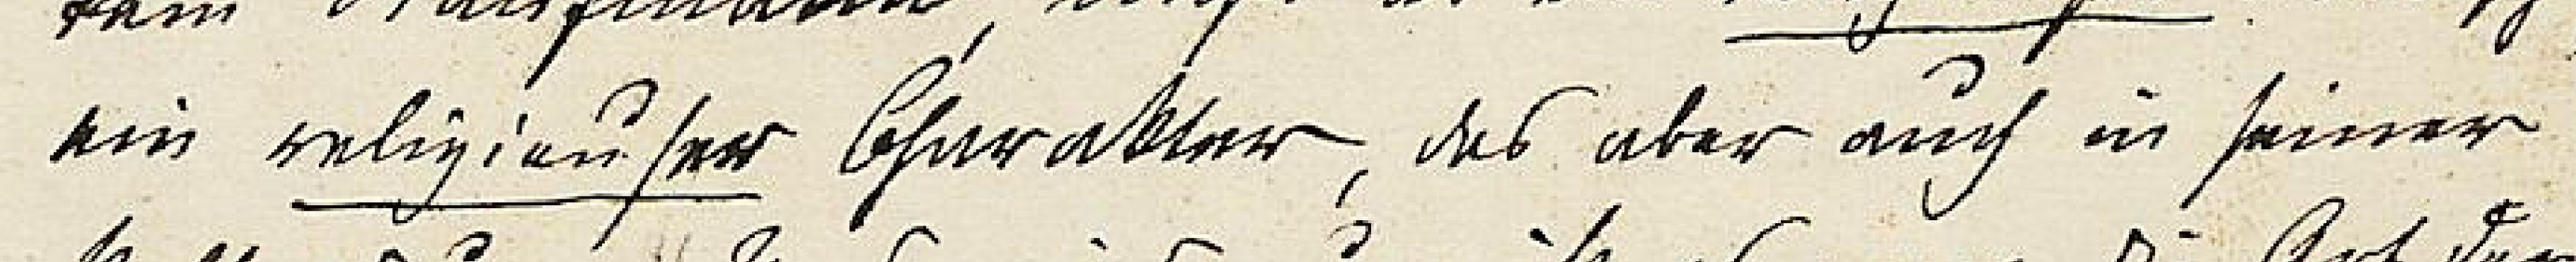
ein religieuser Charakter, das aber auch in seiner
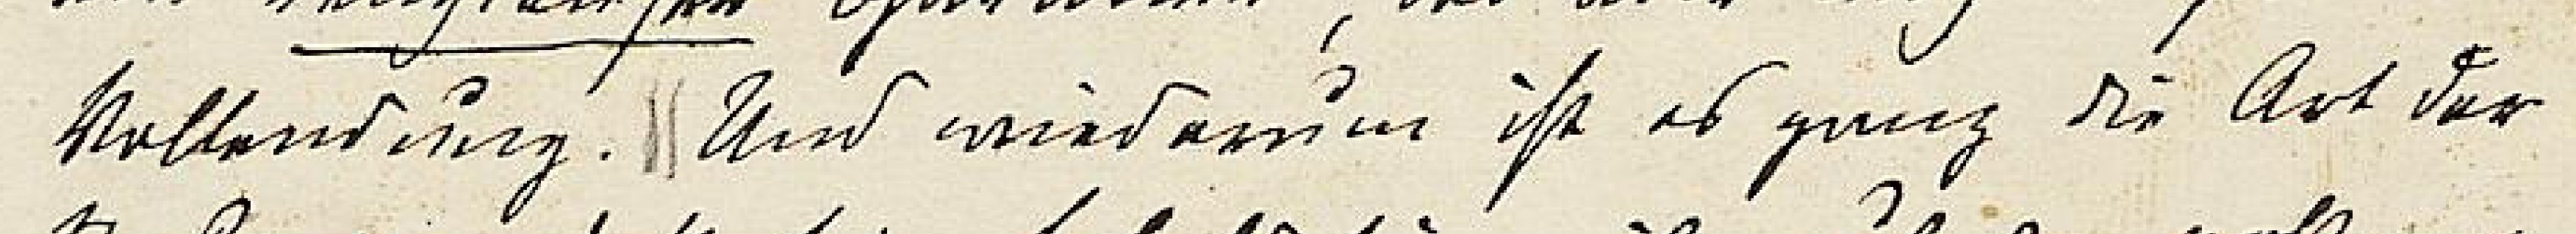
Vollendung. || Und wiederum ist es ganz die Art der
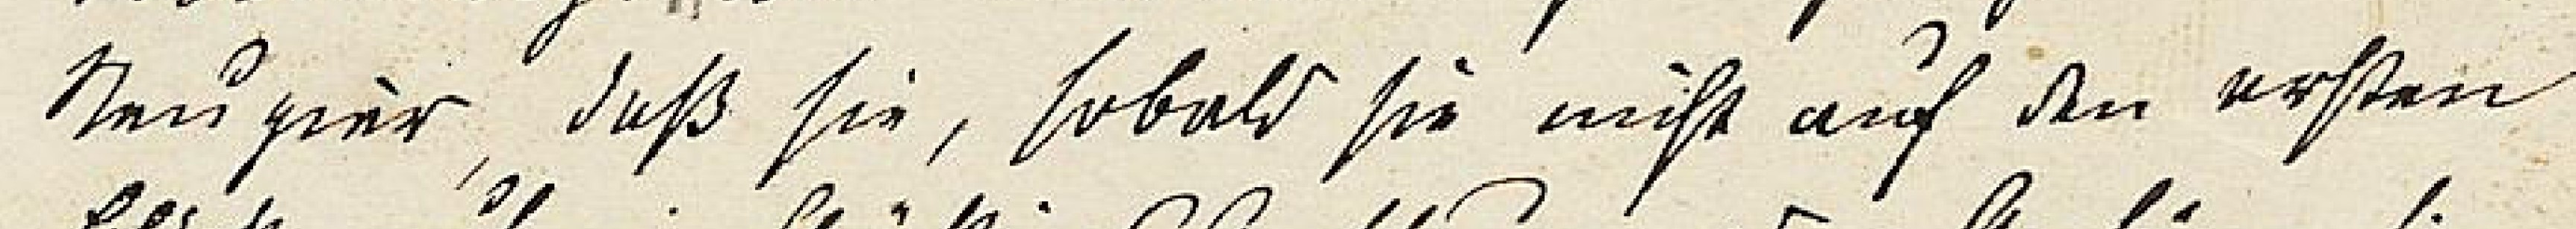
Neugier, daß sie, sobald sie nicht auf den ersten
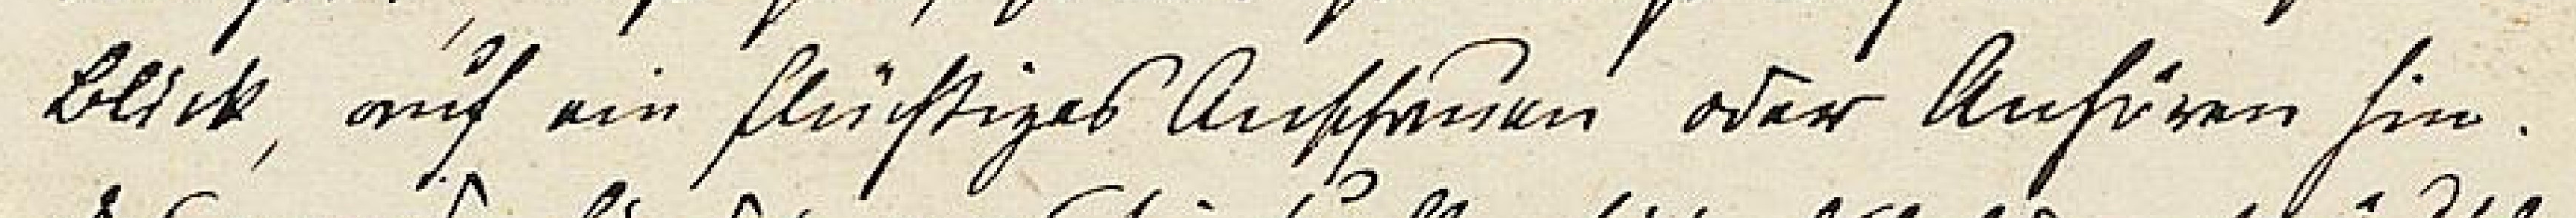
Blick, auf ein flüchtiges Anschauen oder Anhören hin,
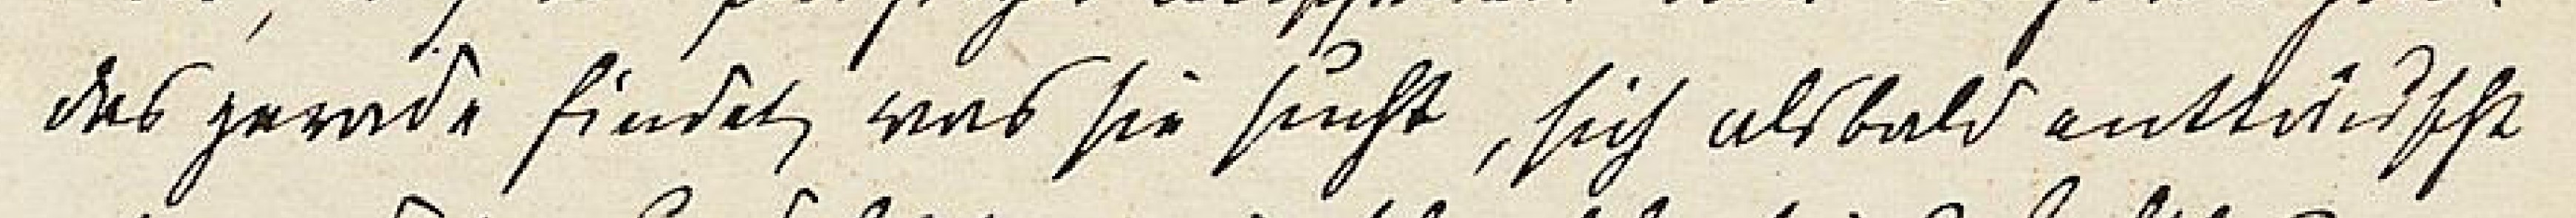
das gerade findet, was sie sucht, sich alsbald enttäuscht
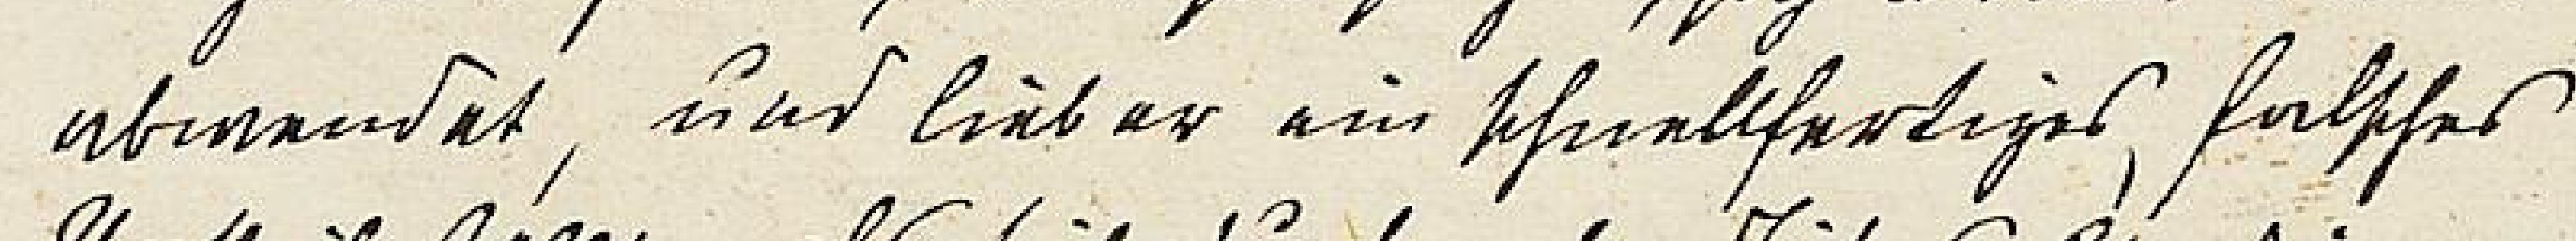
abwendet und lieber ein schnellfertiges, falsches
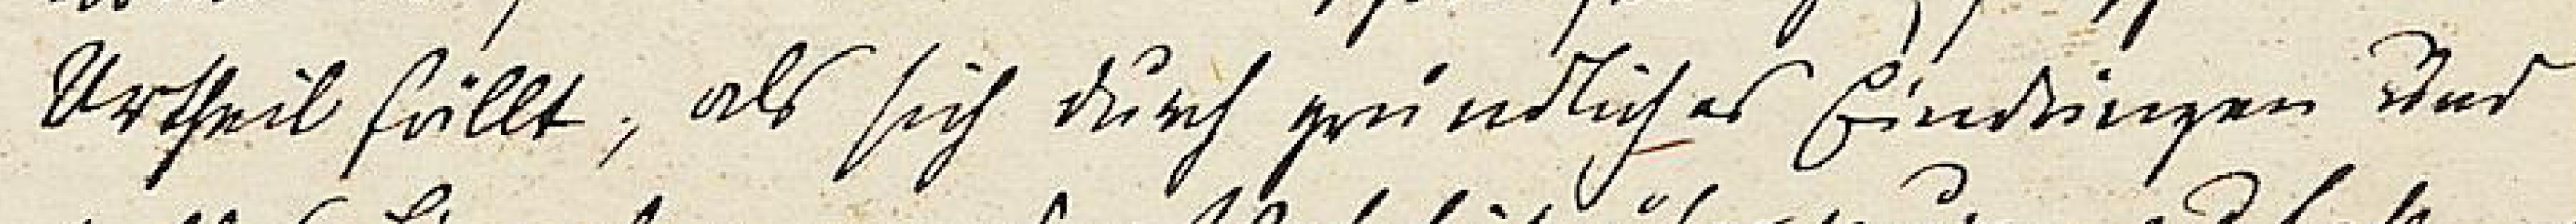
Urtheil fällt, als sich durch gründliches Eindringen und
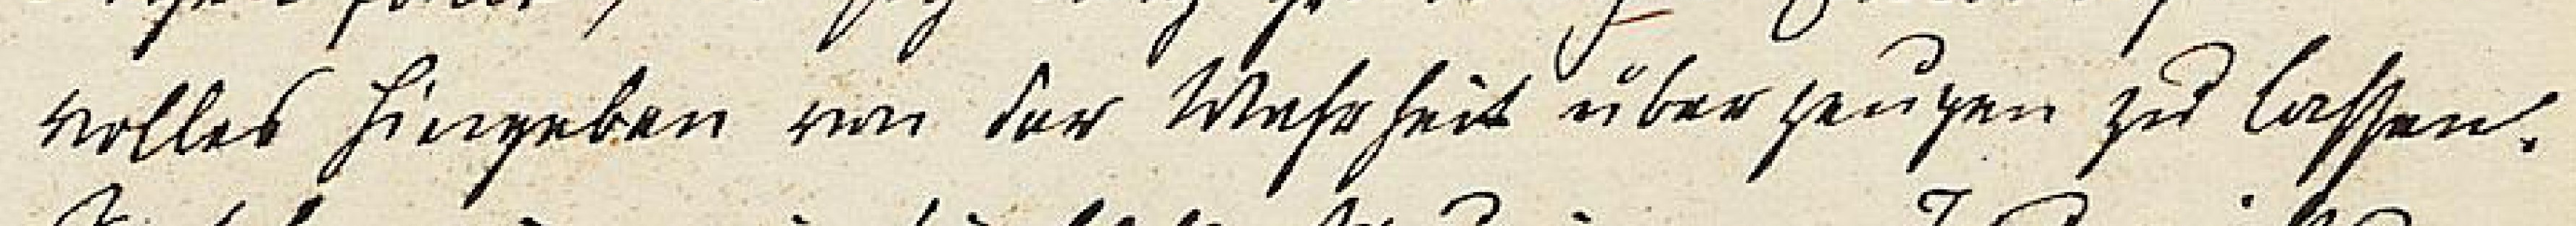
volles hingeben von der Wahrheit überzeungen zu lassen.
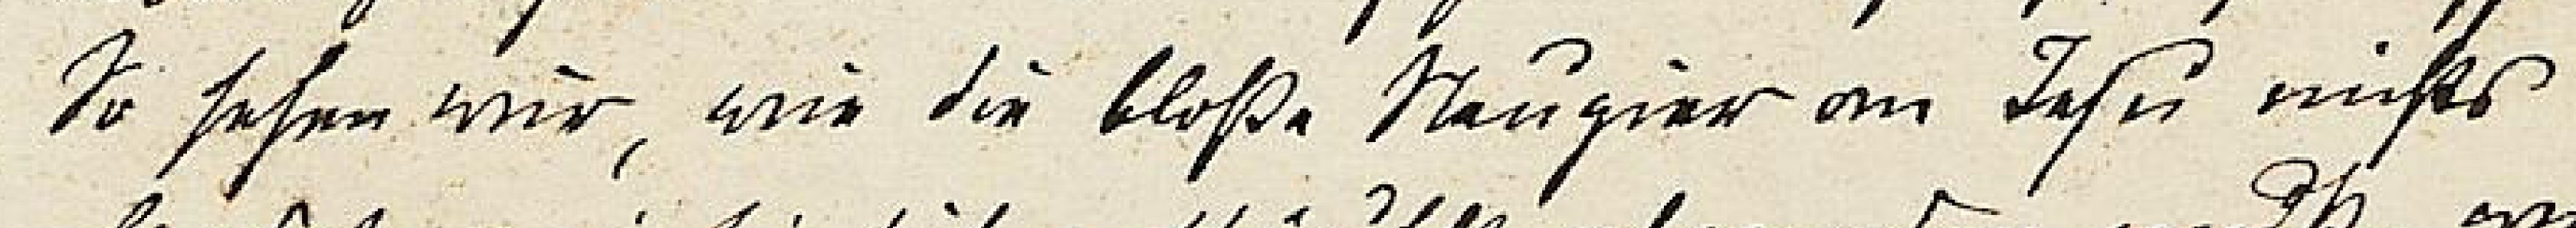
So sehen wir, wie die bloße Neugier an Jesu nichts
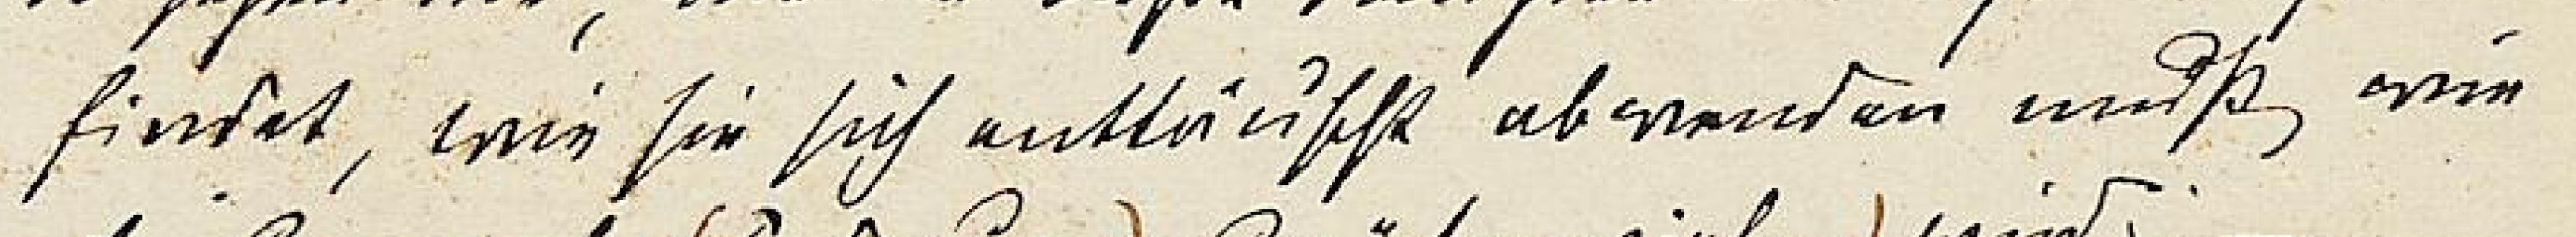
findet, wie sie sich enttäuscht abwenden muß, wie
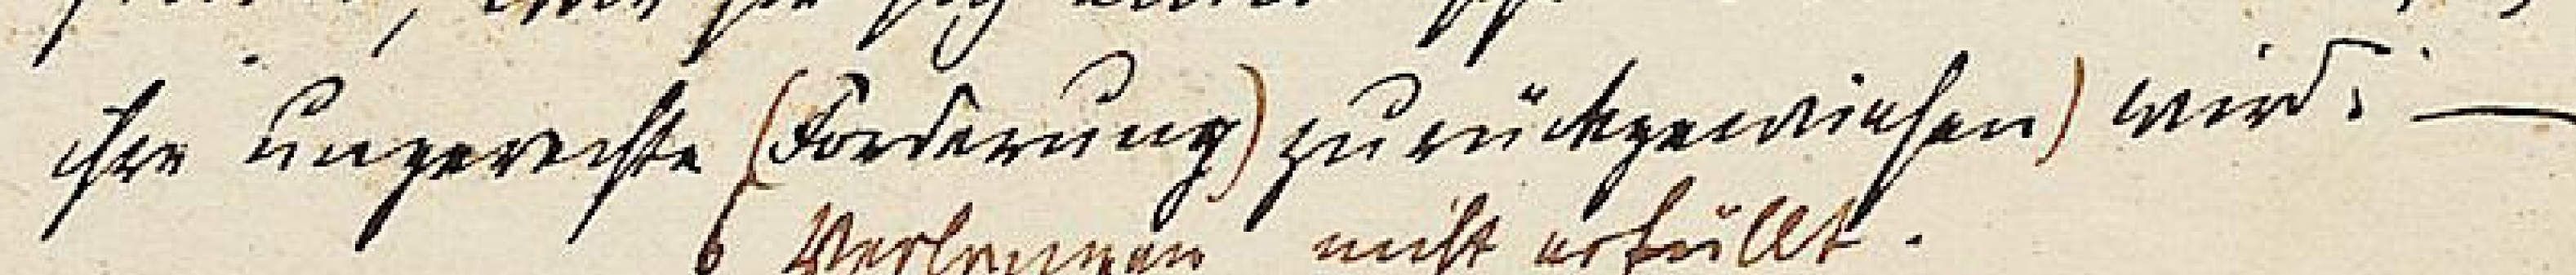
ihre ungerechte (Forederung) zurückgewießen) wird. _
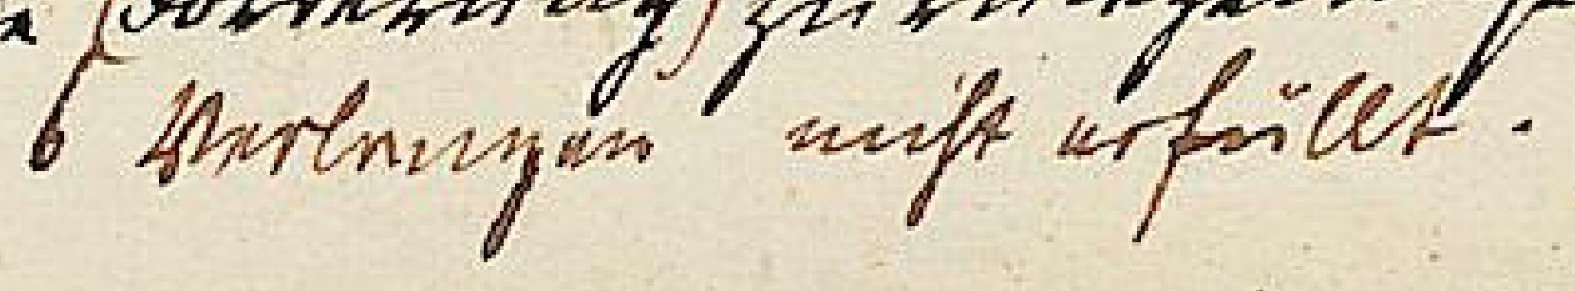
s Verlangen nicht erfüllt.
